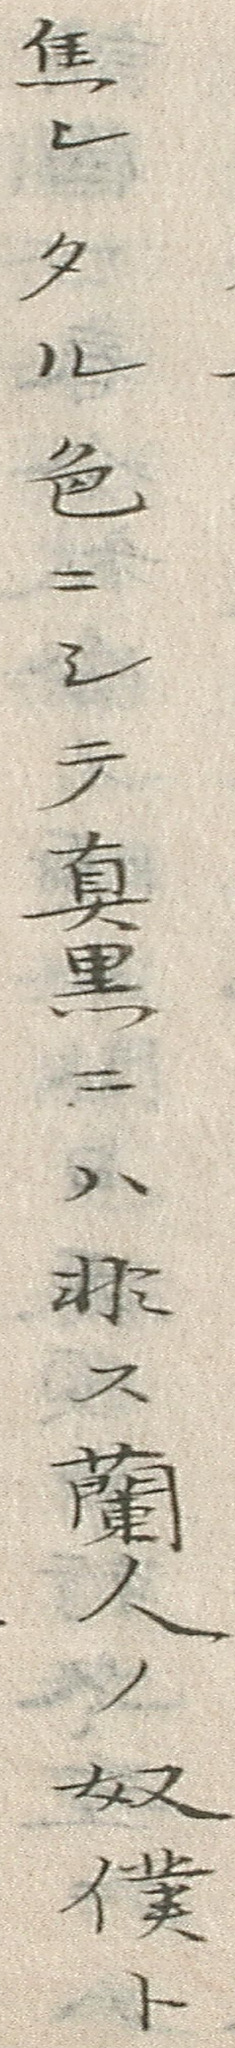焦シタル色ニシテ真黒ニハ非ス蘭人ノ奴僕ト
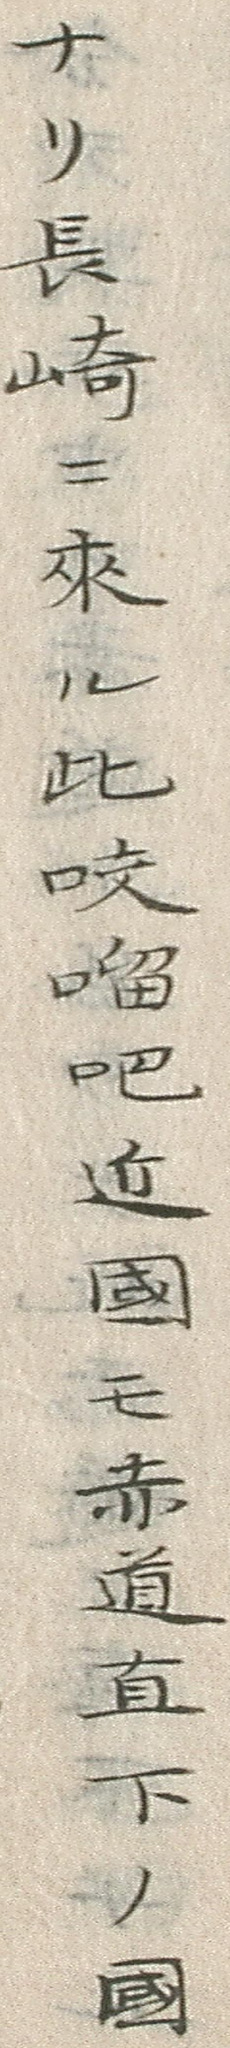ナリ長崎ニ来ル此咬𠺕吧近国モ赤道直下ノ国
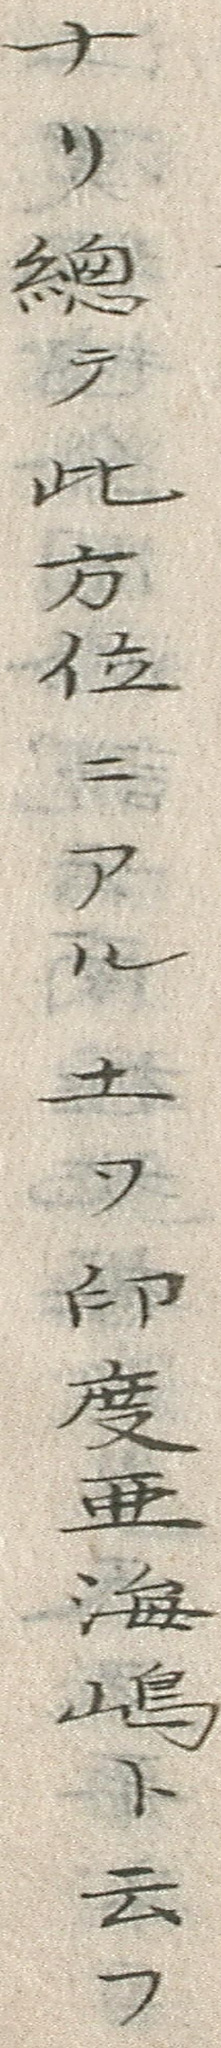ナリ総テ此方位ニアル土ワ印度亜海嶋ト云フ
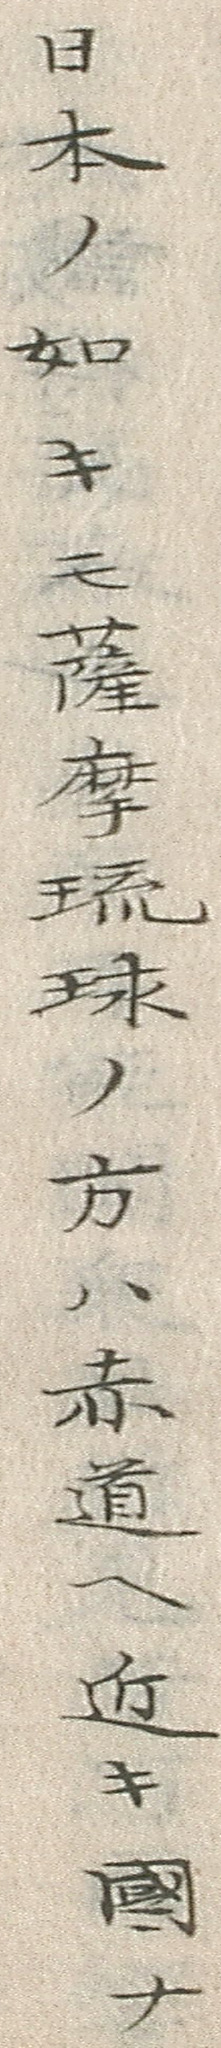日本ノ如キモ薩摩琉球ノ方ハ赤道ヘ近キ国ナ
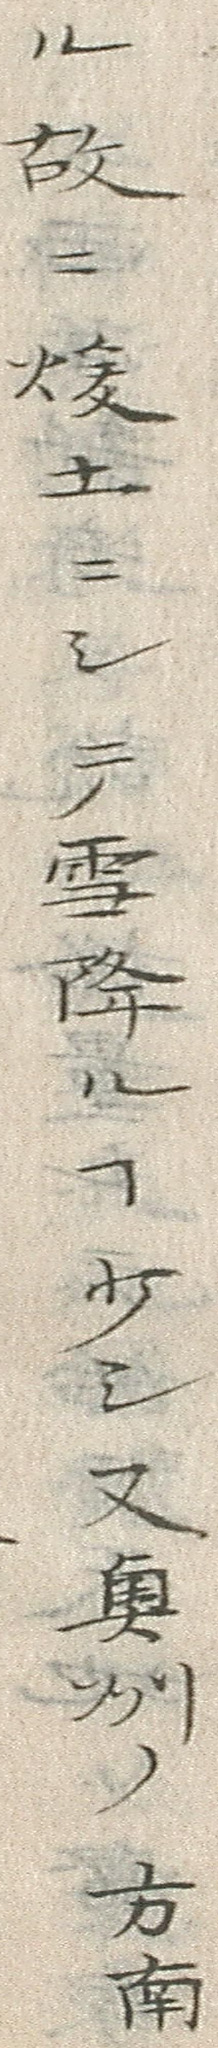ル故ニ煖土ニシテ雪降ルコト少シ又奥州ノ方南
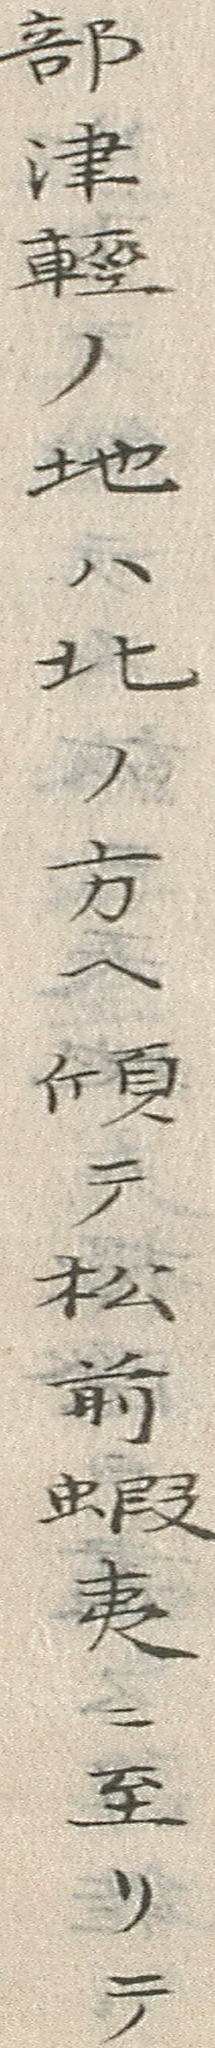部津軽ノ地ハ北ノ方ヘ傾テ松前蝦夷ニ至リテ
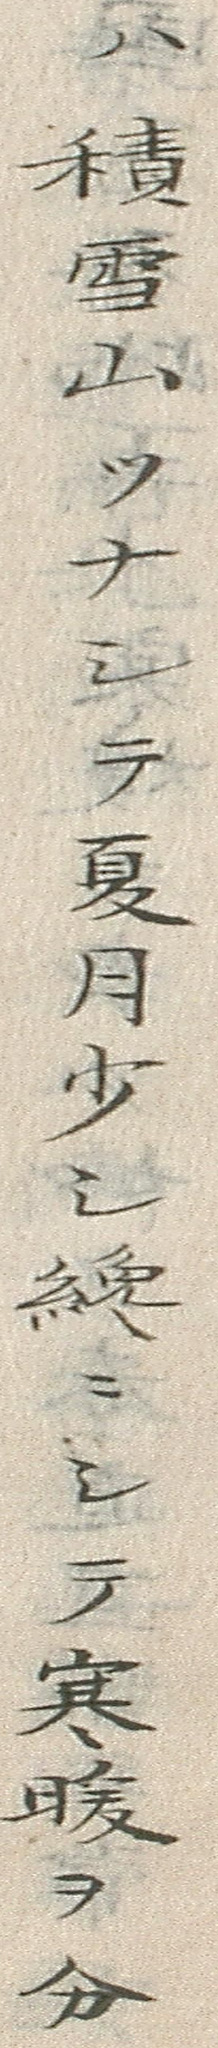ハ積雪山ッナシテ夏月少シ僅ニシテ寒暖ヲ分
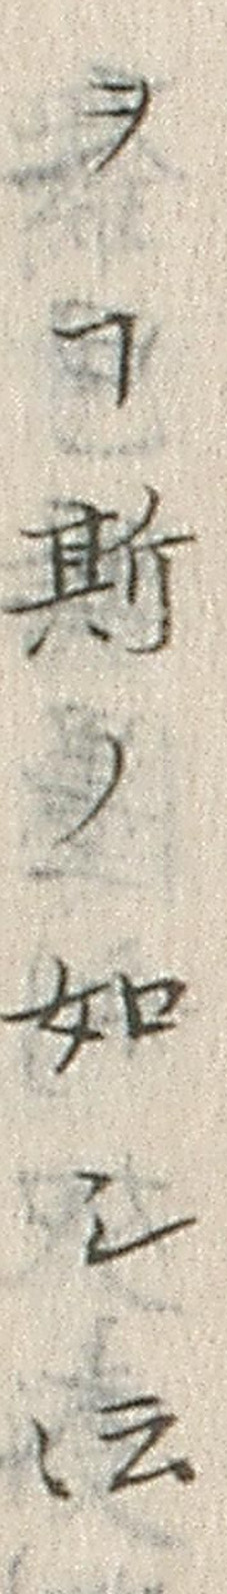ヲコト斯ノ如シ云〻
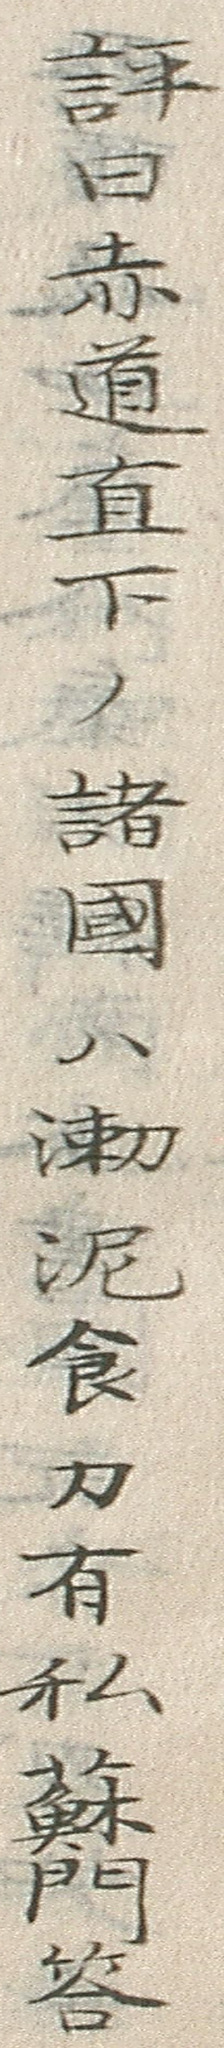評曰赤道直下ノ諸国ハ？泥食カ有私蘇門答
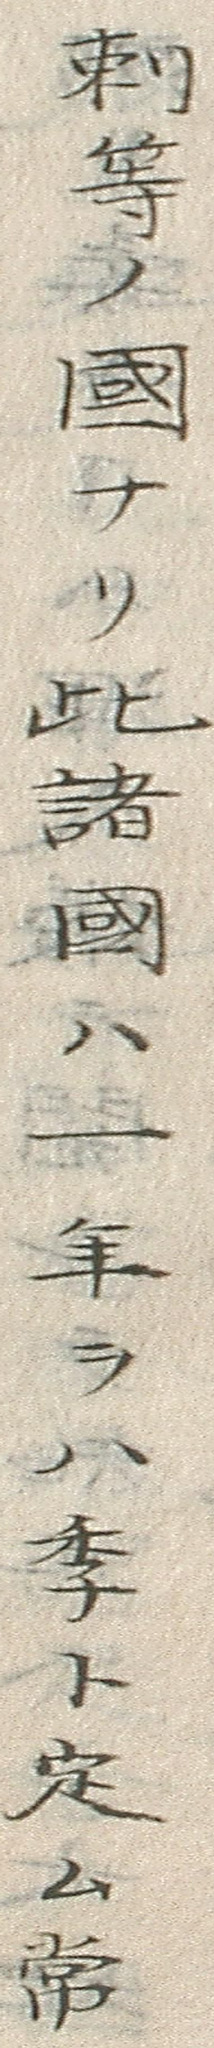剌等ノ国ナリ此諸国ハ一年ヲハ季ト定ム常
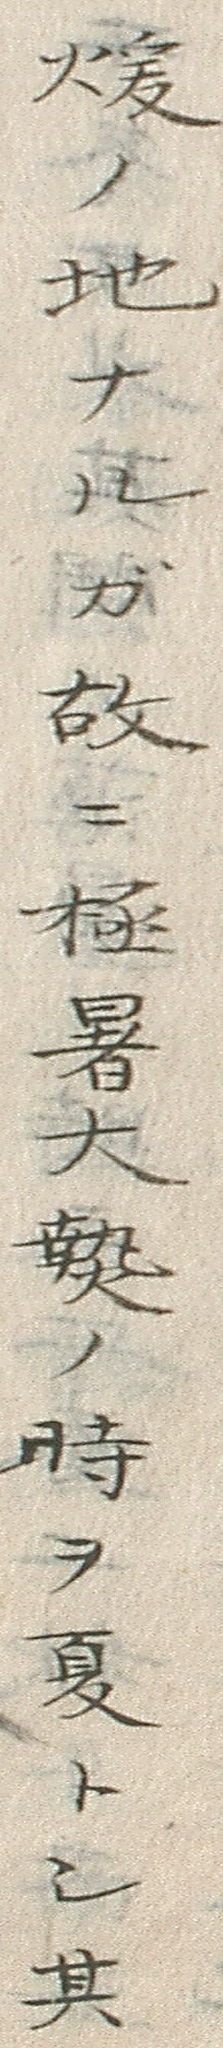煖ノ地ナルガ故ニ極暑大熱ノ時ヲ夏トシ其
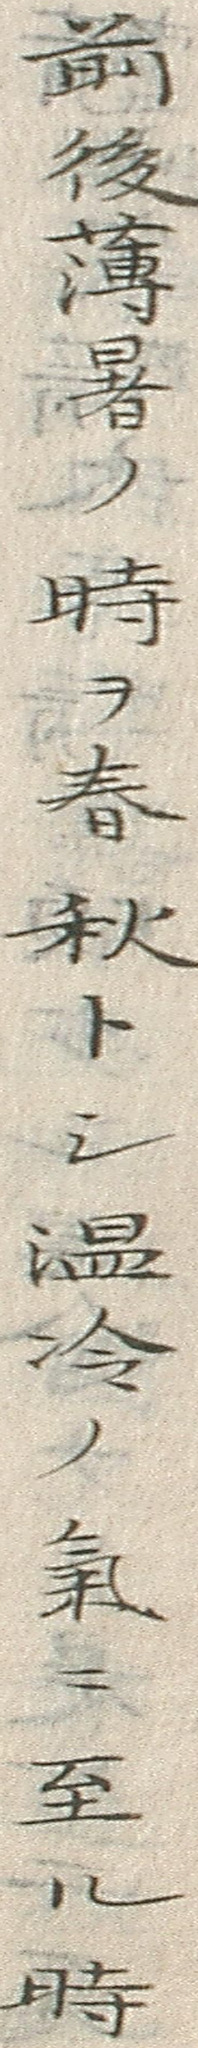前後薄暑ノ時ヲ春秋トシ温冷ノ気ニ至ル時
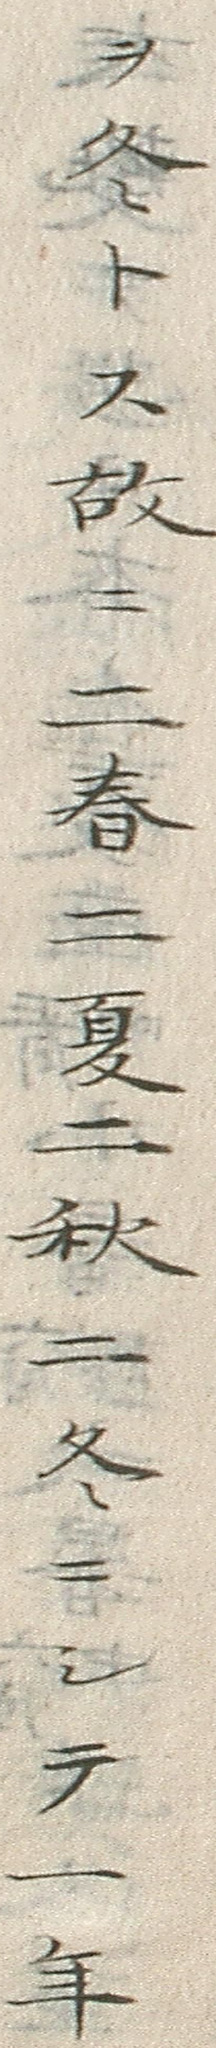ヲ冬トス故ニ二春二夏二秋二冬ニシテ一年
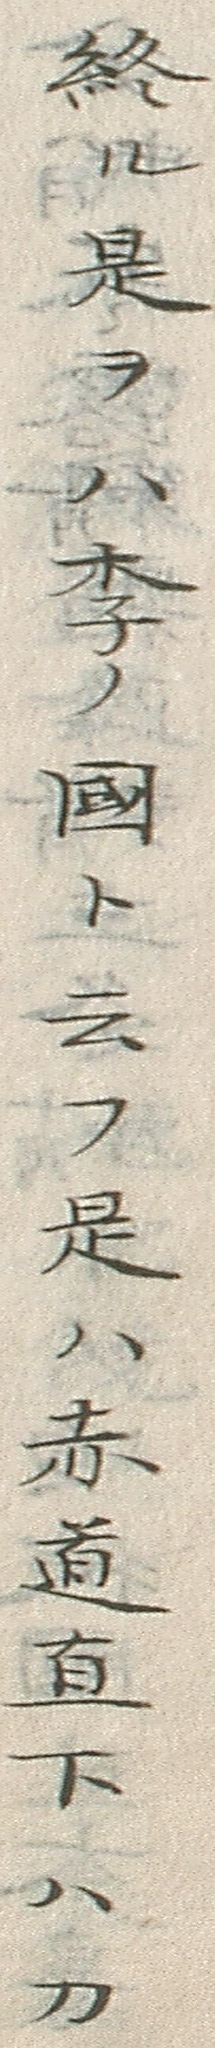終ル是ヲハ李ノ国ト云フ是ハ赤道直下ハカ
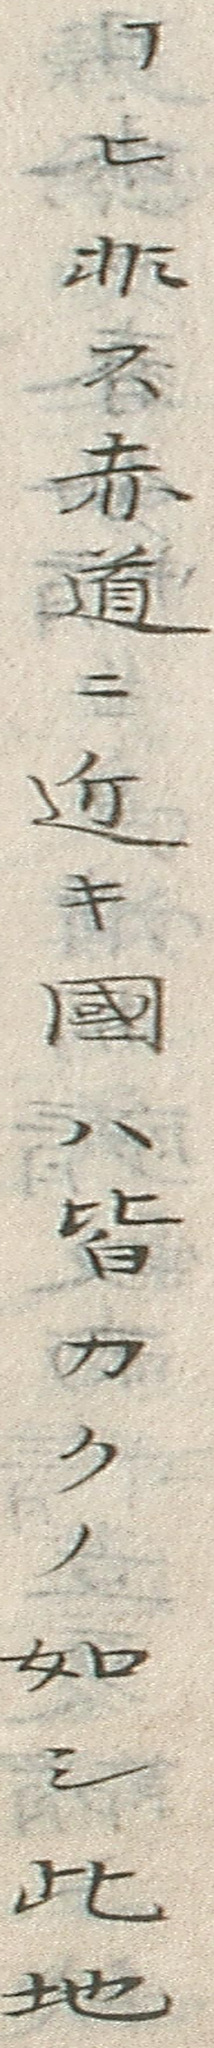フヒ非ス赤道ニ近キ国ハ皆カクノ如シ此地
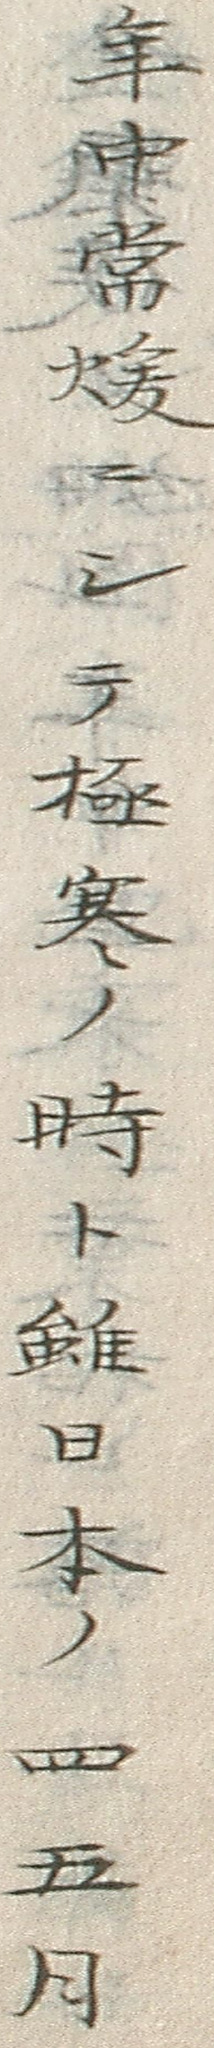年中常煖ニシテ極寒ノ時ト雖日本ノ四五月
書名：天學略名目羽翼　全
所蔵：東京大学地震研究所図書室 Earthquake Research Institute Library, The University of Tokyo, JAPAN
